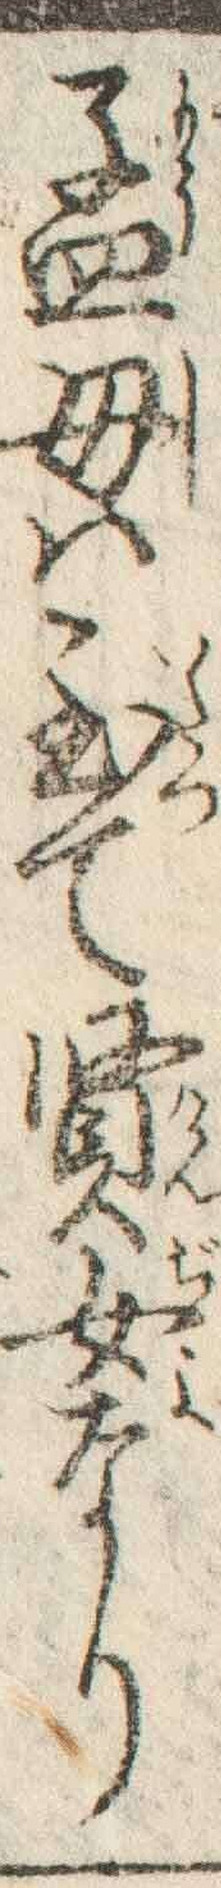孟母は至て賢女なり
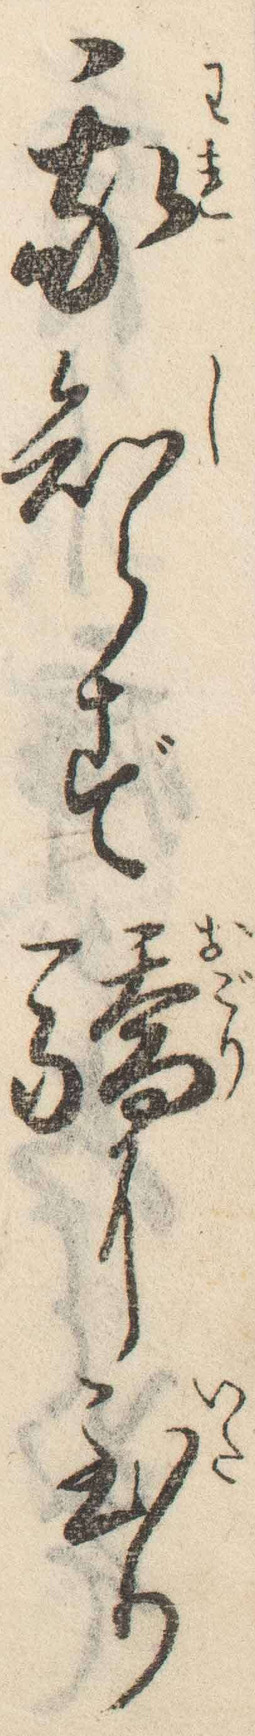我知らず驕り至り
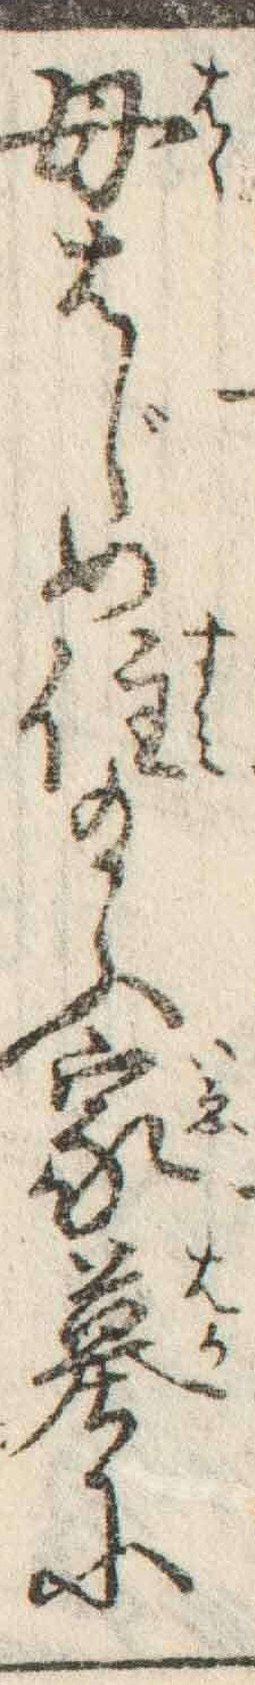母はじめ住給ふ家墓に
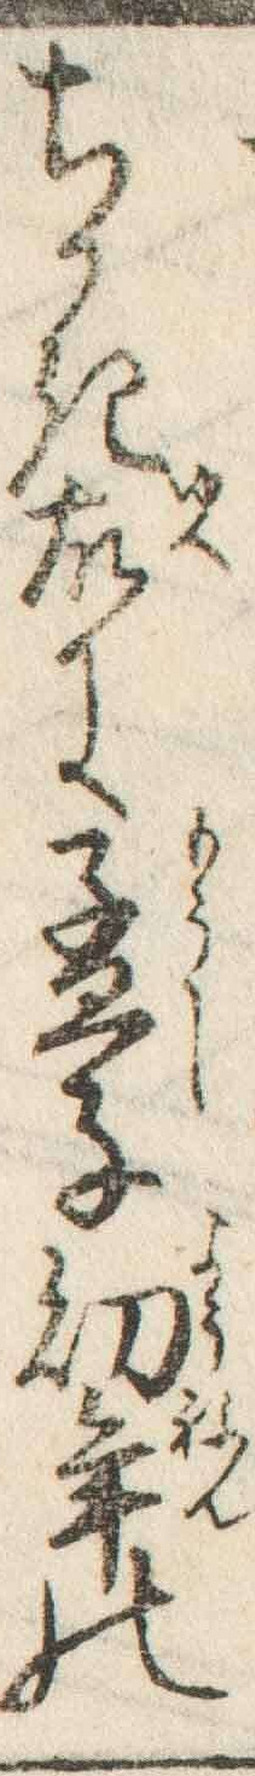ちかき故孟子幼年の
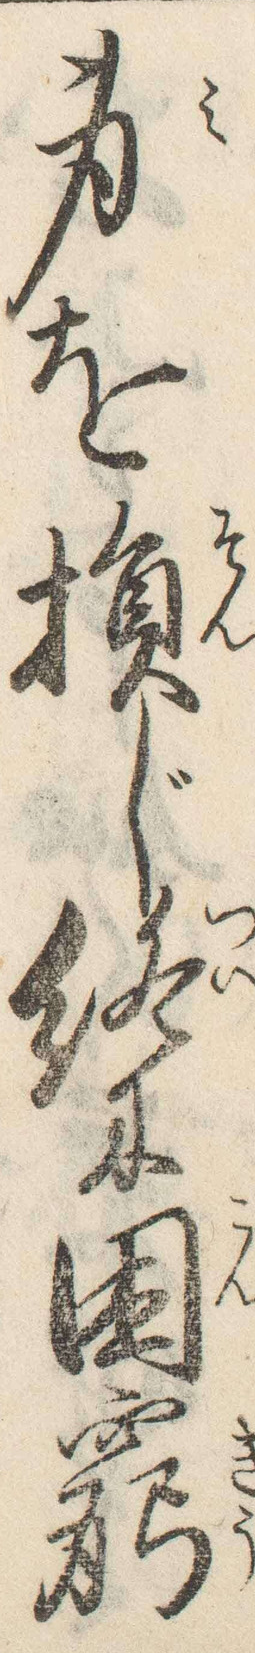身を損じ終に困窮
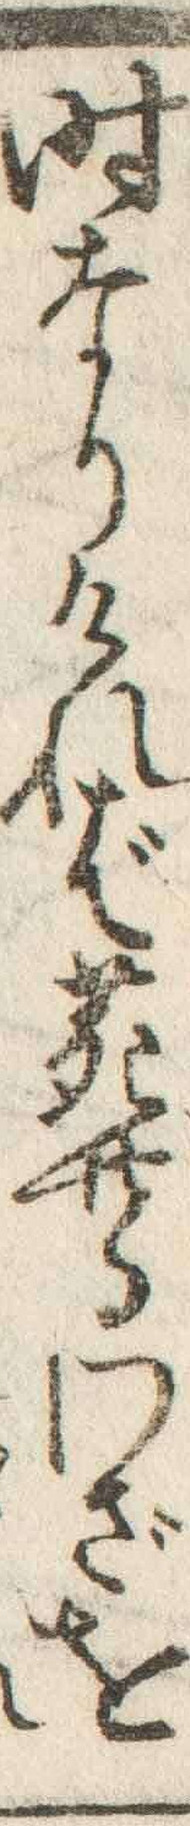時なりければ葬るわざを
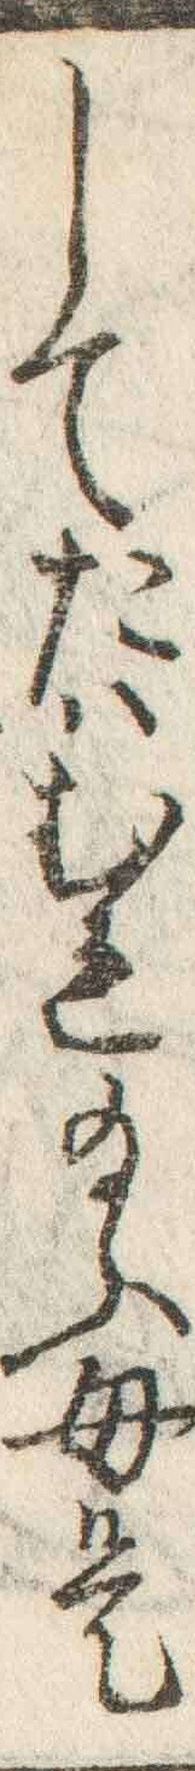してたはむれ給ふ母是
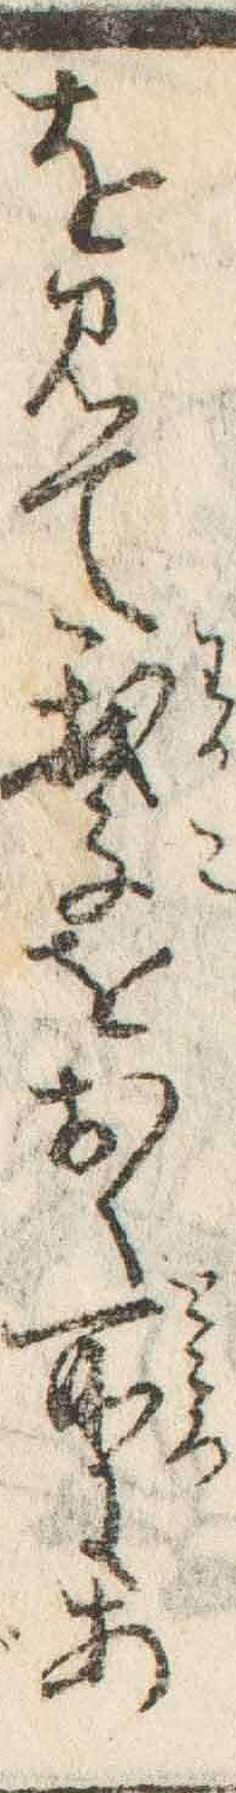を見て我子をおく所にあ
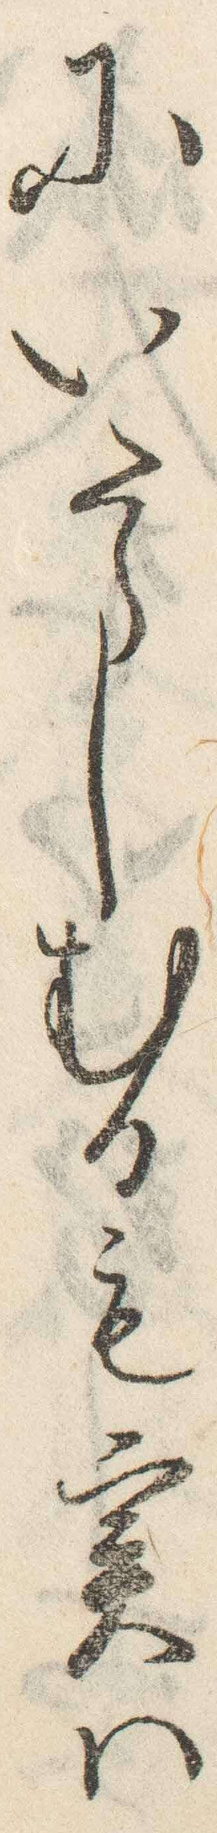にいたらしむるも実は
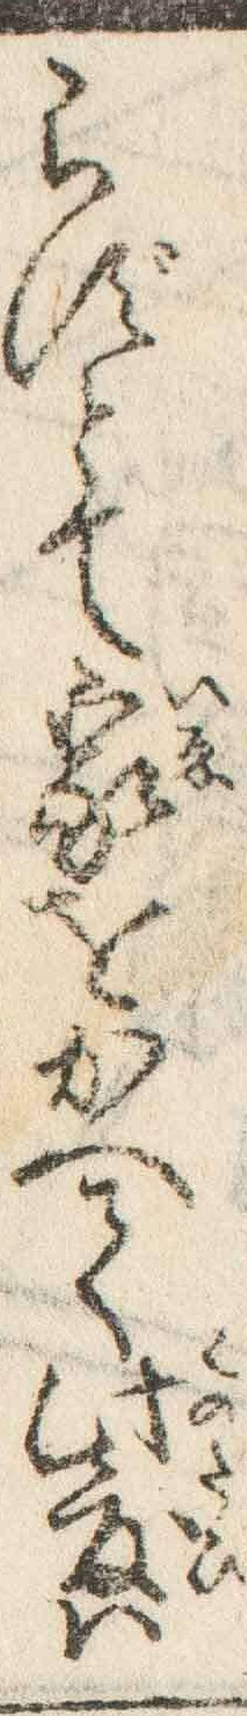らずとて家をかへて此度は
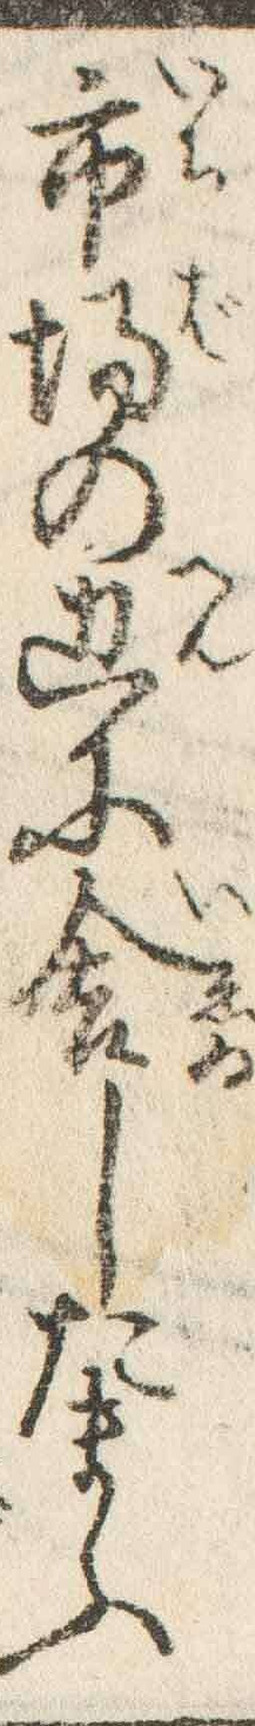市場の辺に舎したまふ
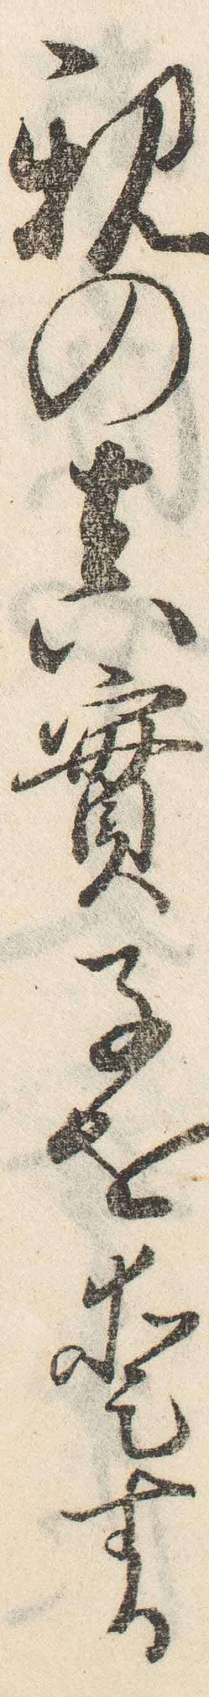親の真実子を愛する
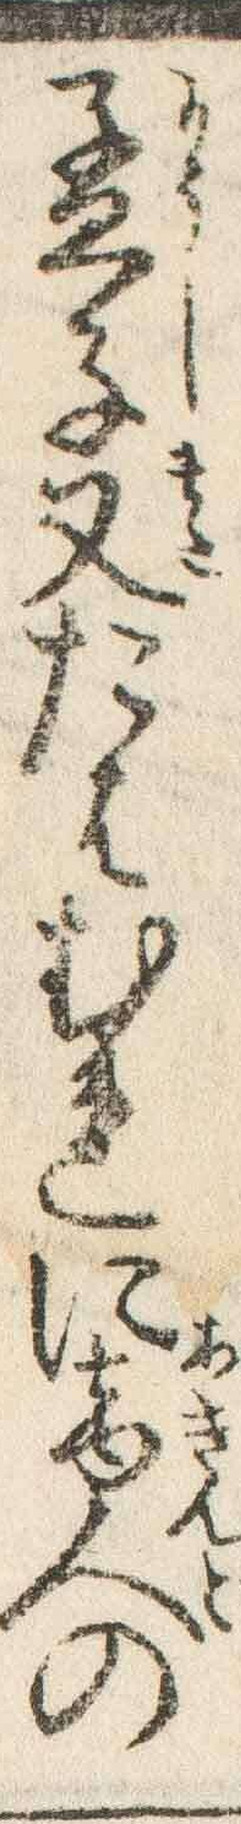孟子又たはむれに商人の
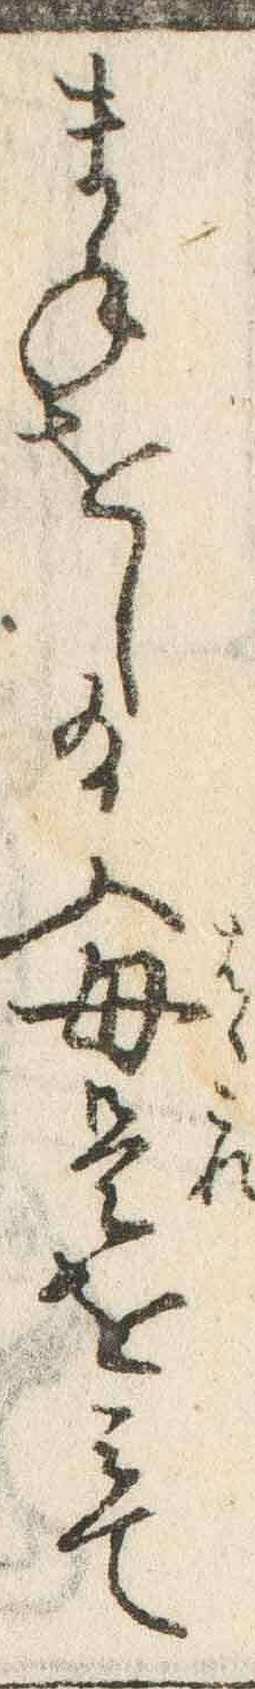まねをし給ふ母是をみて
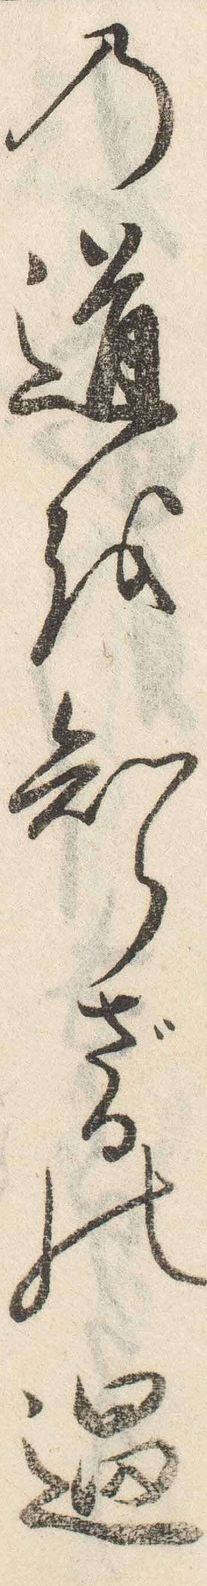の道を知らざるの過
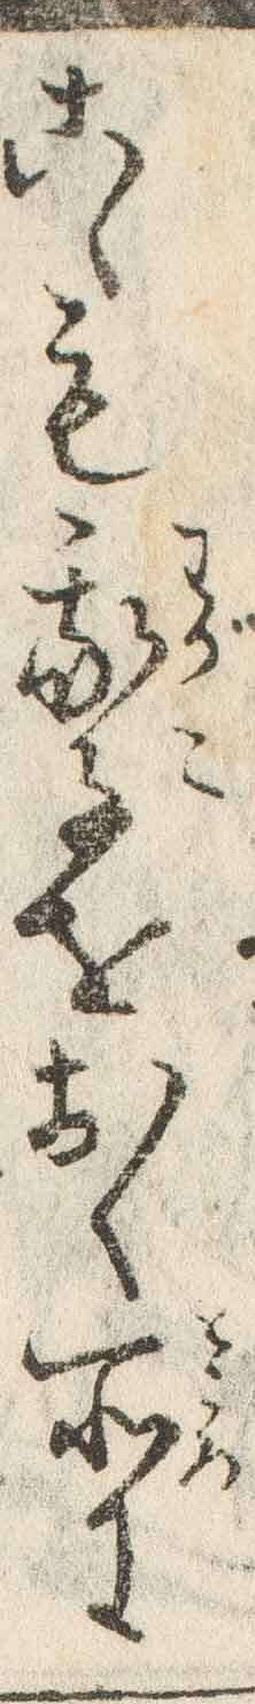こゝも我子をおく所に
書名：撫育草
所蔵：東京学芸大学附属図書館 国文学研究資料館
